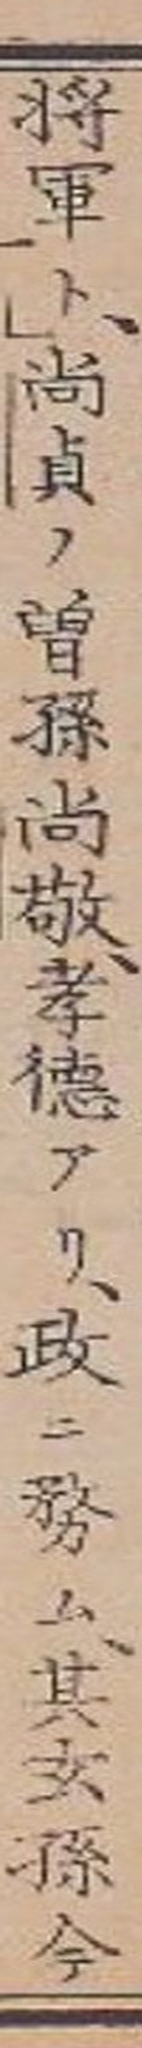将軍ト、」尚貞ノ曾孫尚敬、孝徳アリ、政ニ務ム、其玄孫今
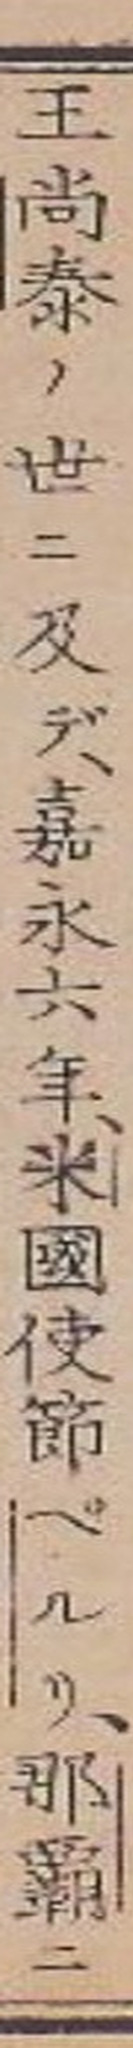王尚泰ノ世ニ及デ、嘉永六年、米国使節ペルリ、那覇ニ
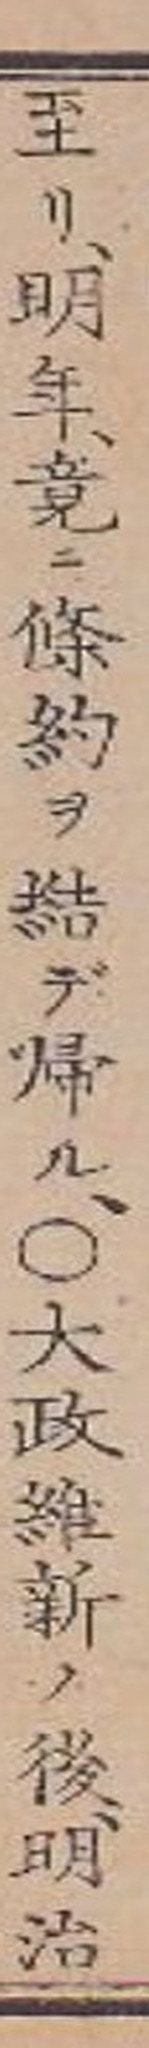至リ、明年、竟ニ条約ヲ結デ帰ル、○大政維新ノ後、明治
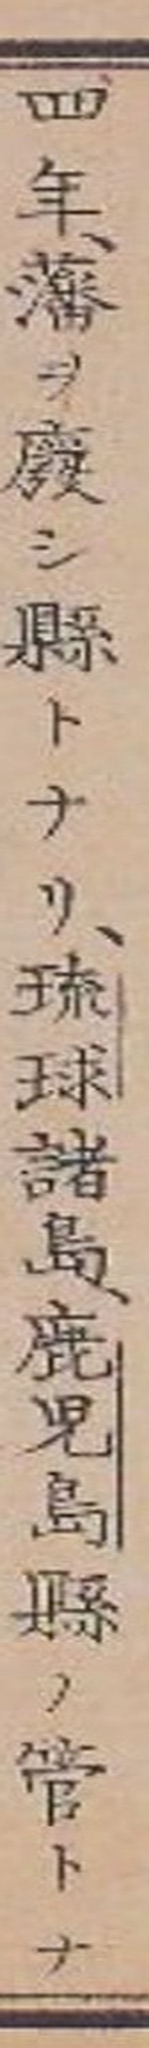四年、藩ヲ廃シ県トナリ、琉球諸島、鹿児島県ノ管トナ
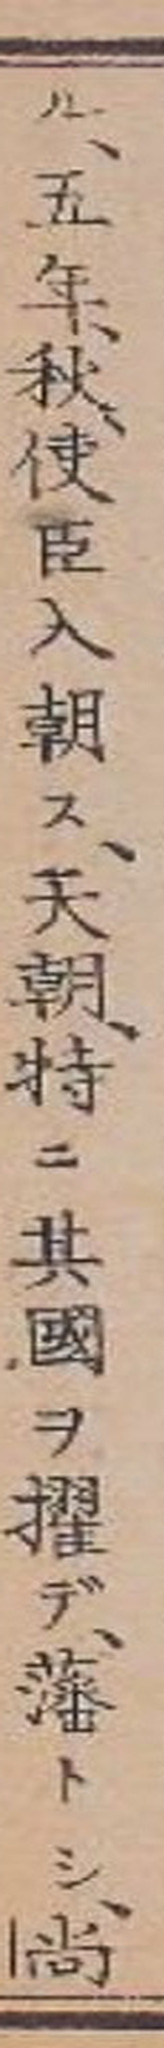ル、五年、秋、使臣入朝ス、天朝、特ニ其国ヲ擢デ、藩トシ、尚
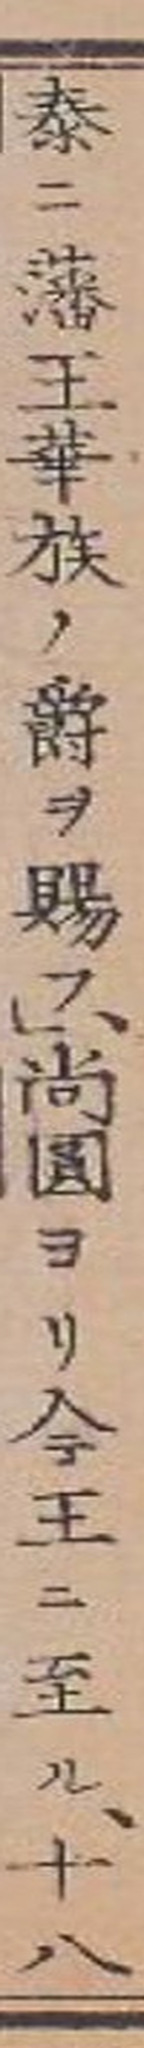泰ニ藩王華族ノ爵ヲ賜フ、」尚円ヨリ今王ニ至ル、十八
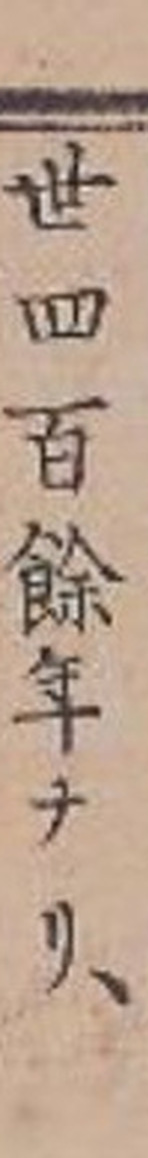世四百余年ナリ、
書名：琉球新誌 巻上
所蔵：University of the Ryukyus Library
